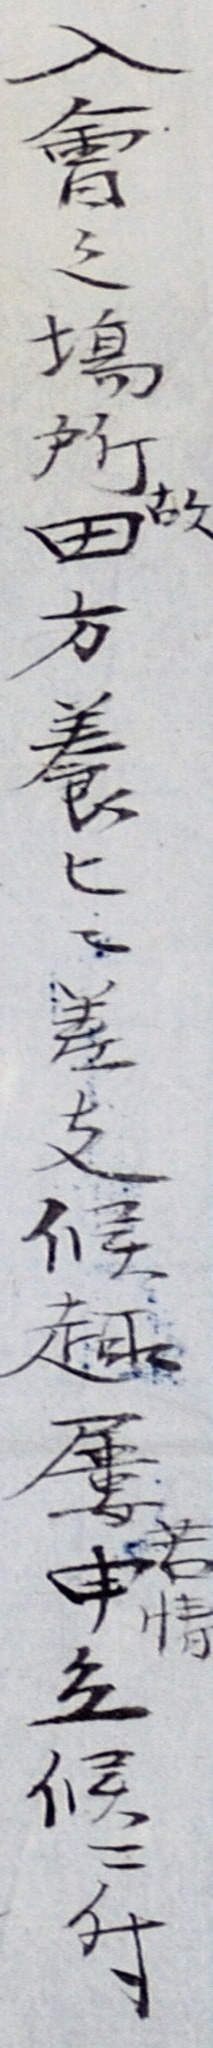入会之場所故田方養ヒニ差支候趣屢苦情申立候ニ付
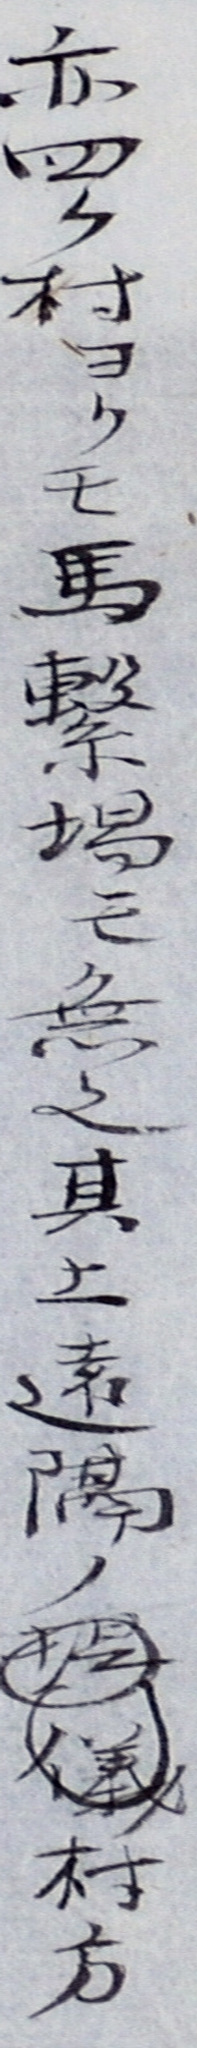亦四ヶ村ヨリモ馬繋場モ無之其上遠隔ノ儀村方
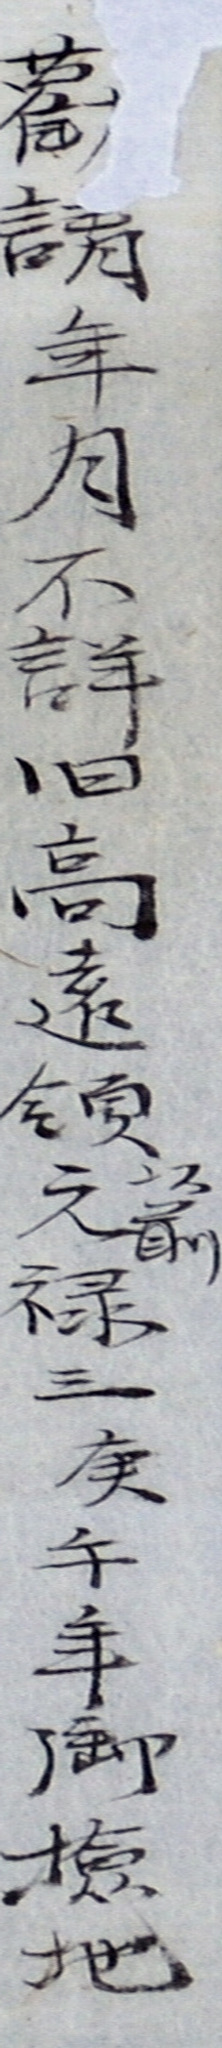勧請年月不詳旧高遠領以前元禄三庚午年御検地
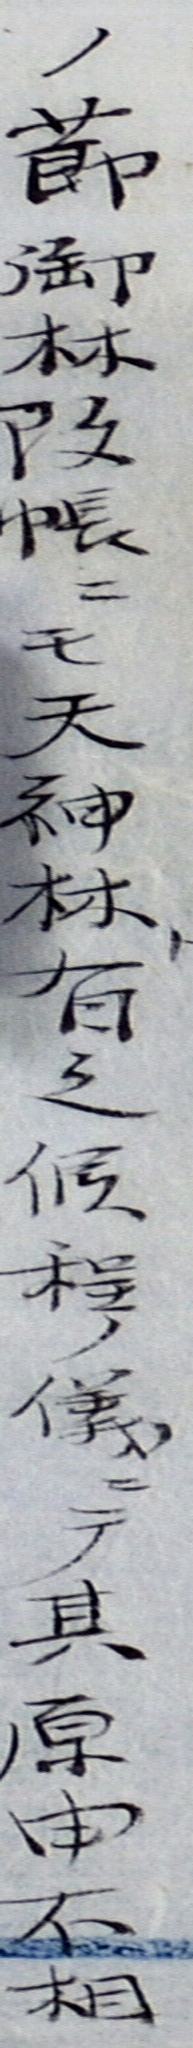ノ節御林改帳ニモ天神林ト有之候程ノ儀ニテ其原由不
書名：火山村官林并北林村官林ニ付
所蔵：伊那市立高遠町図書館・合同会社AMANE
